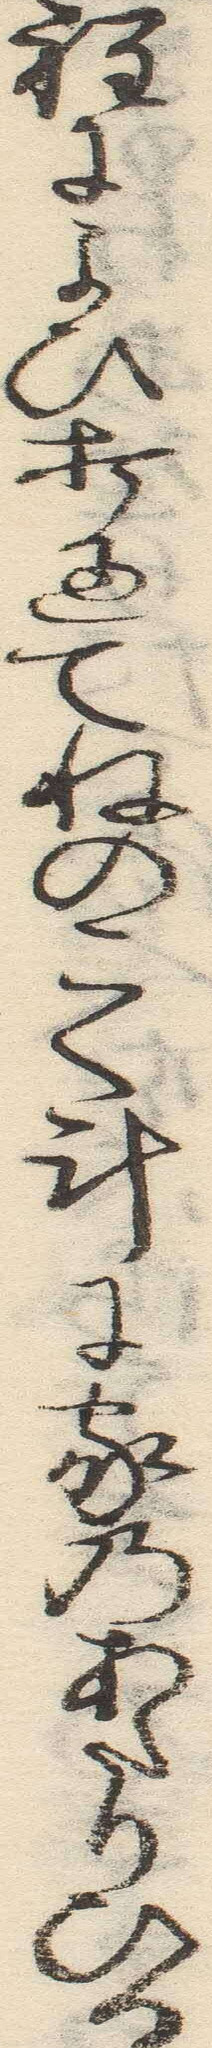程によひ打過てねのこく計に家のあたりひる
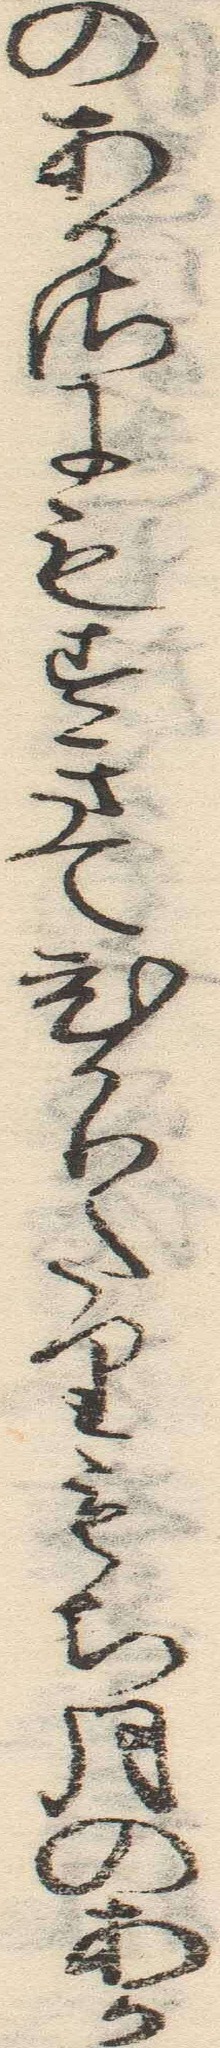のあかさにもすきてひかりたりもち月のあか
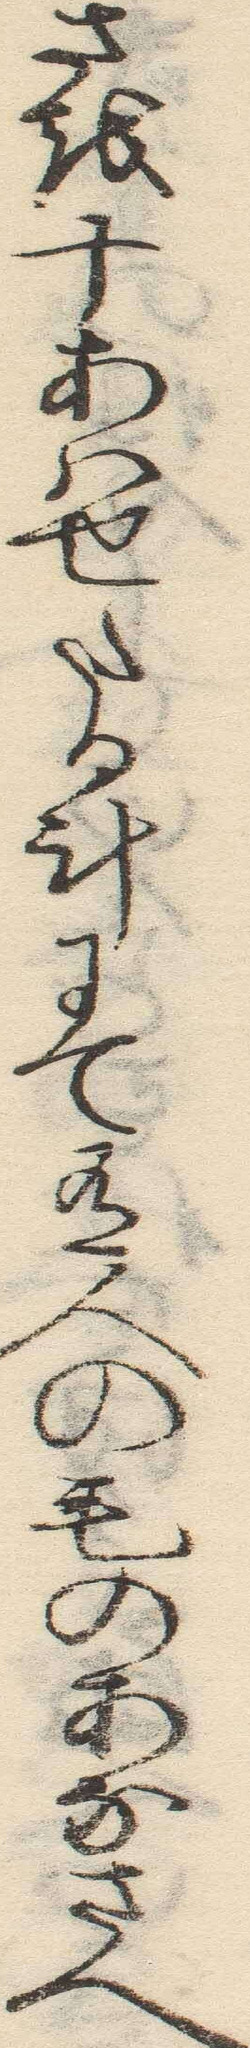さを十あはせたる計にて有人の毛のあなさへ
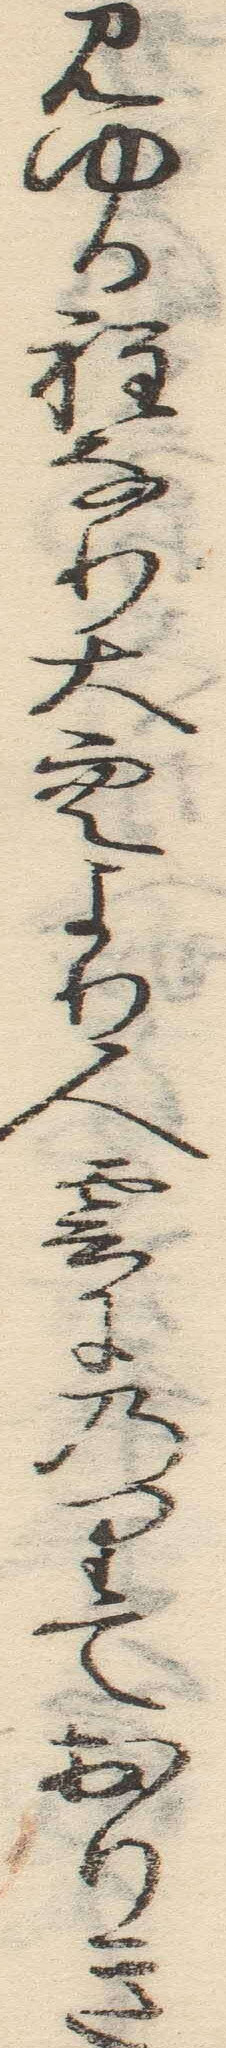見ゆる程なり大空より人雲にのりておりき
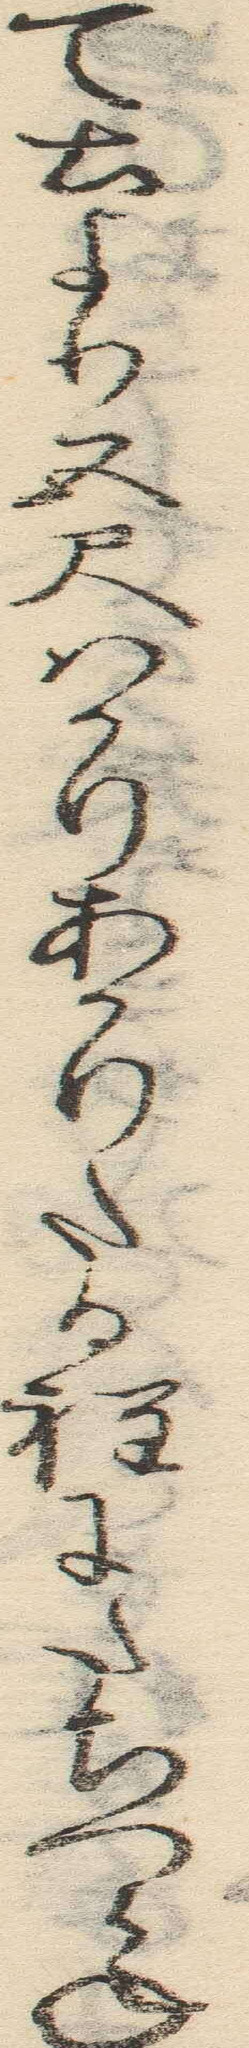て土より五尺はかりあかりたる程にたちつらね
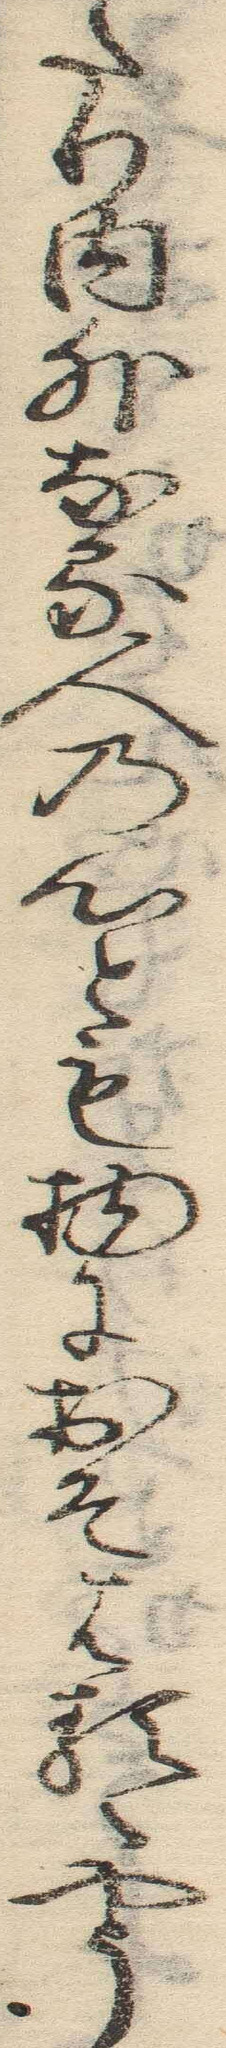たり内外なる人の心とも物におそはるゝやう

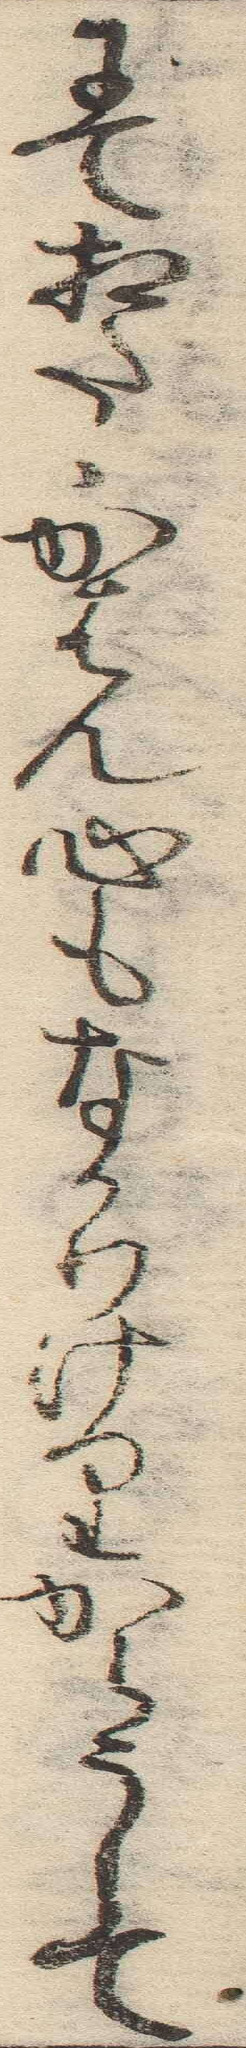にて相たゝかはん心もなかりけりからうして
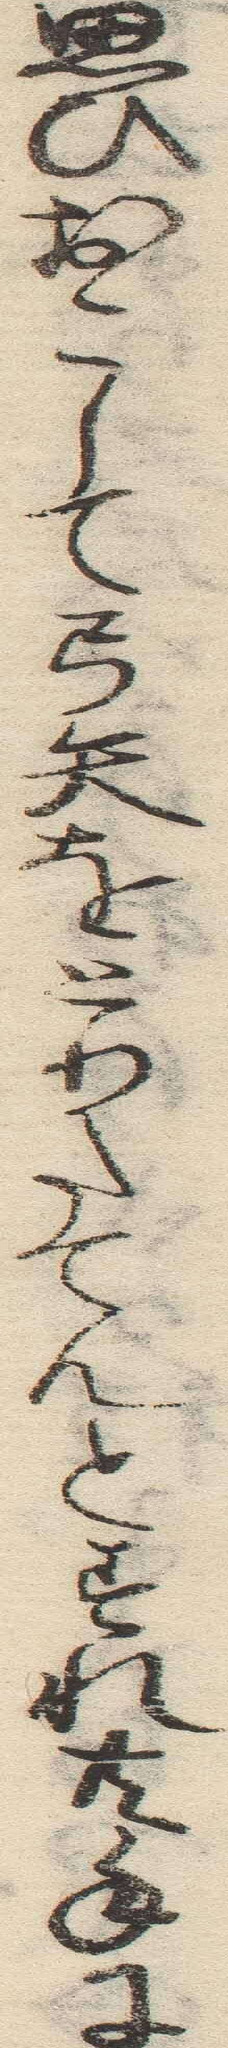思ひおこして弓矢をとりたてんとすれ共手に
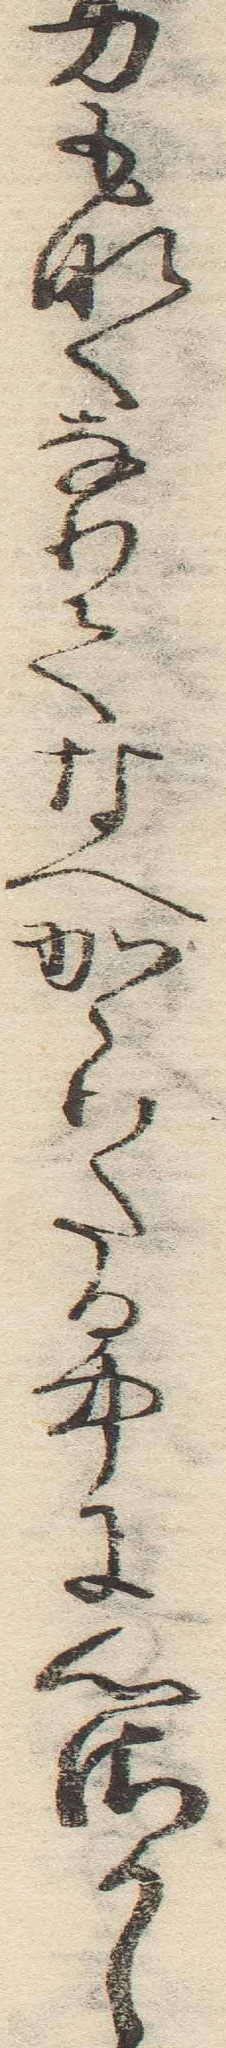力もなくなりてなへかゝりたる中に心さかし
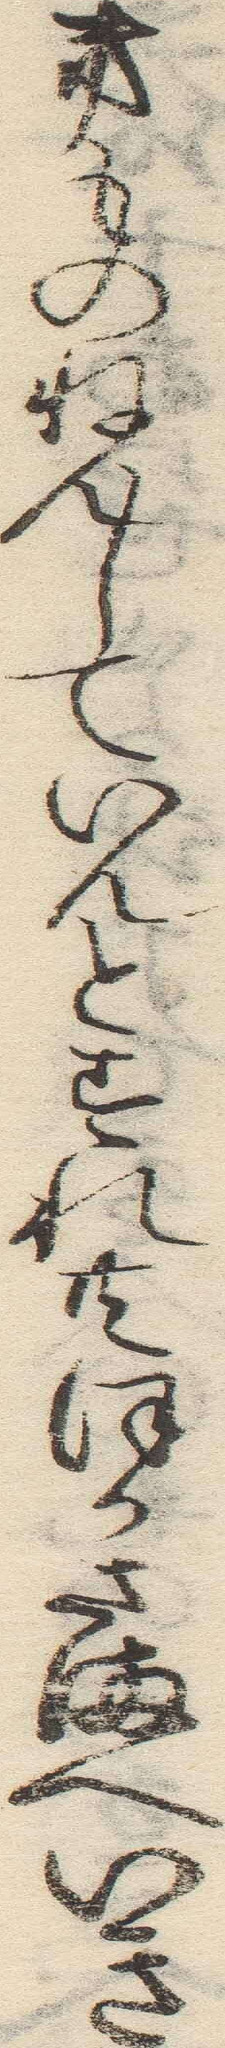きものねんしていんとすれ共ほかさまへいき
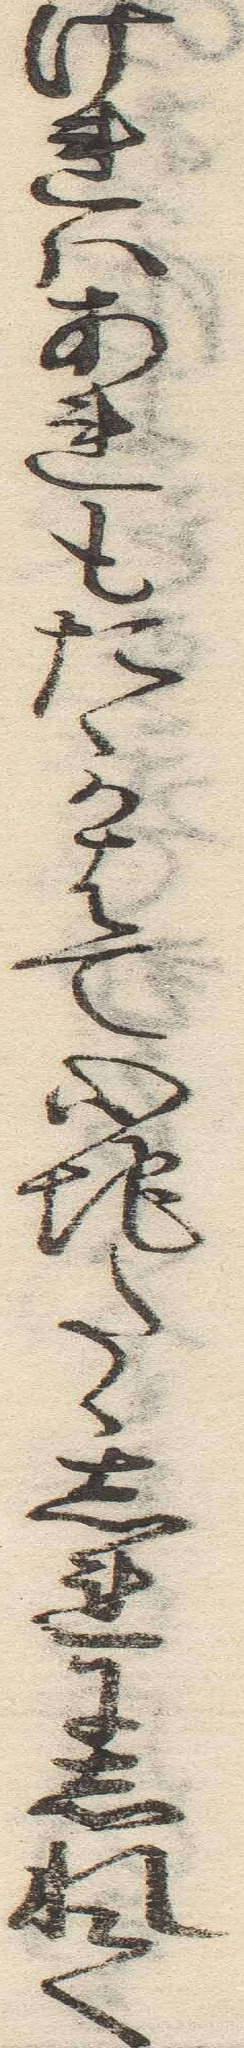けれはあれもたゝかはて心地たゝしれにしれて
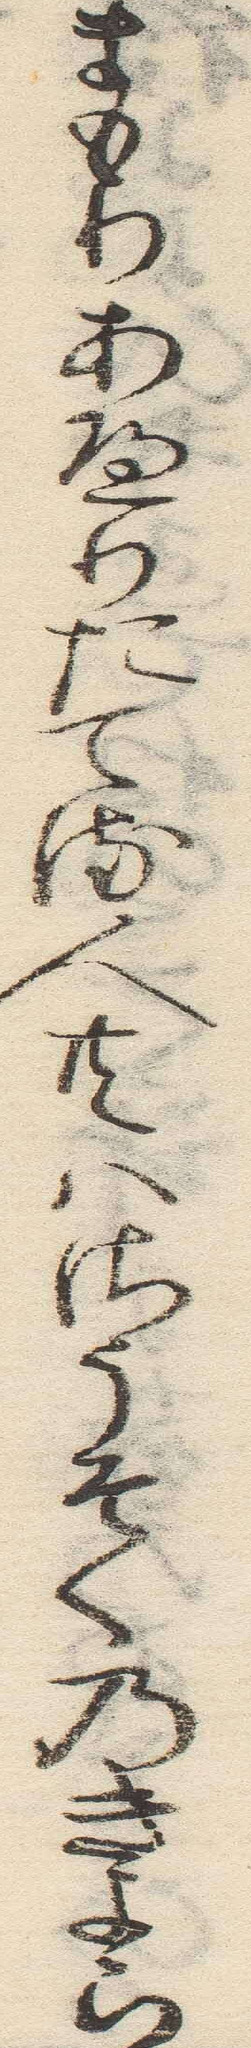まもりあへりたてる人共はさうそくのきよら
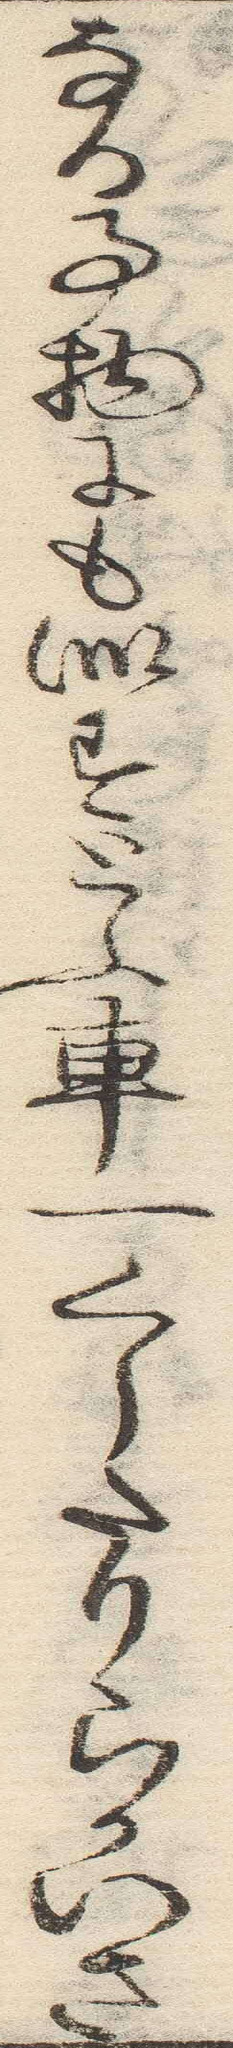なる事物にも似すとふ車一くしたりらかいさ
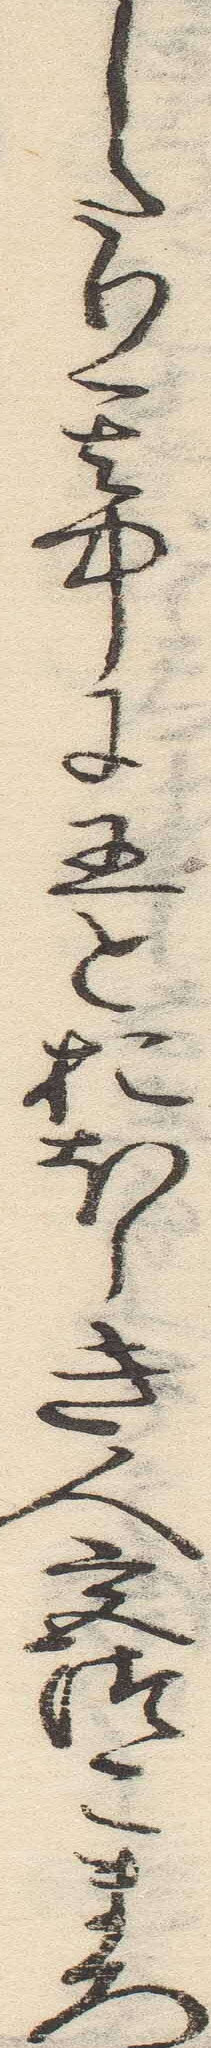したり其中に王とおほしき人宮つこまろ
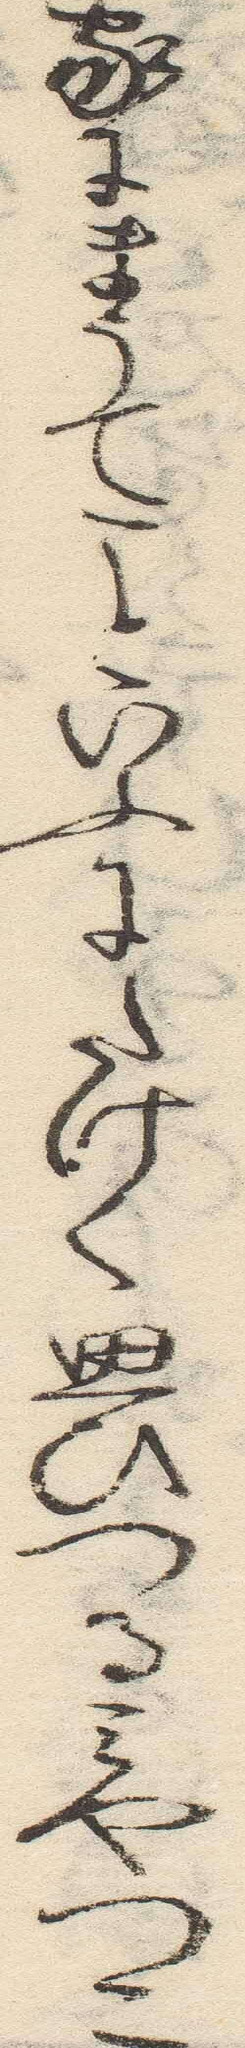家にまうてこといふにたけく思ひつるみやつこ
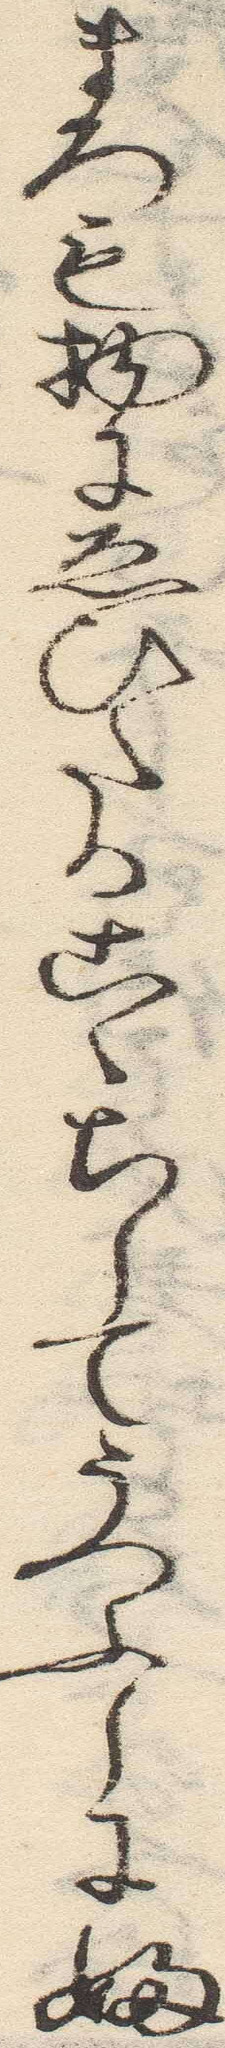まろも物にゑひたるこゝちしてうつふしにふ
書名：竹取物語
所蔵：東京学芸大学附属図書館 国文学研究資料館
